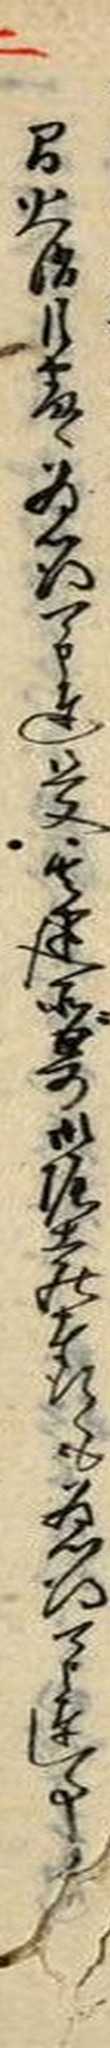間火消月番へ為心得可申達且又其建所に寄御堀土居奉行へも為心得可申達事

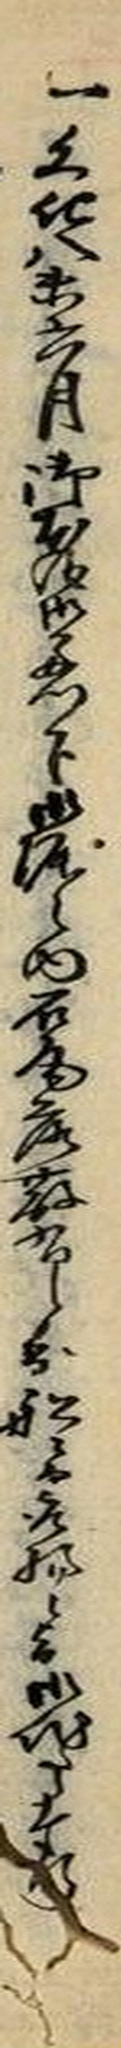一文化八未六月御本丸御多門下御堀之内石瓦落散有之分船にて取揚候旨御作事奉行
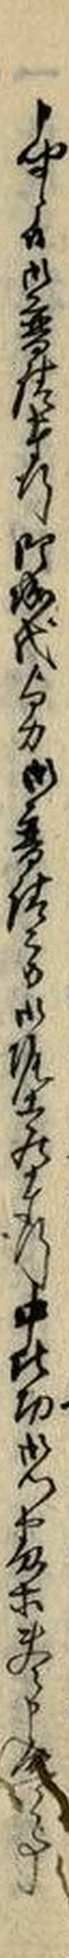申聞候に付御普請奉行御城代与力御普請方御堀土居奉行中仕切御門番等夫々申通候事
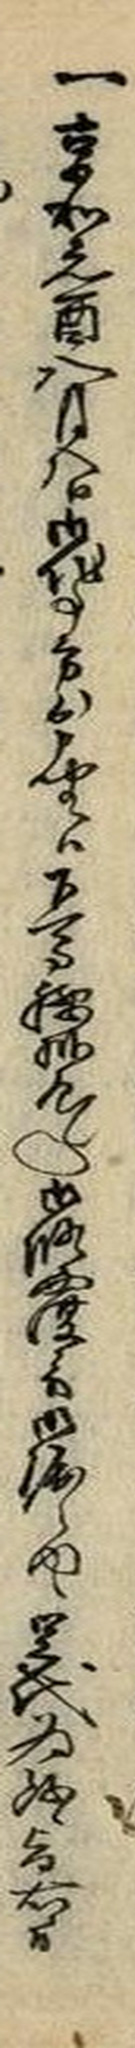一享和元酉八月八日御作事方ゟ申聞候は下馬腰掛屋ね御修覆に付御堀之内へ足代為致候旨右に付
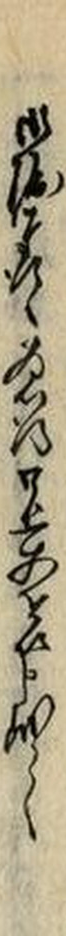御堀奉行へ為心得口上使を以申越之
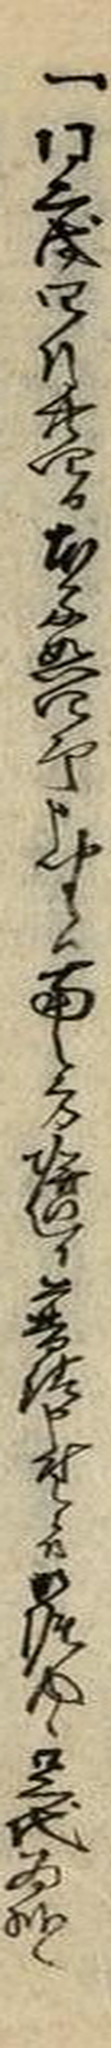一同二戌四月廿四日本多恕四郎申聞候は南之方塀廻り普請申付候に付御堀内へ足代為掛候
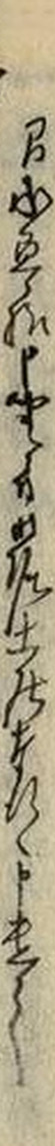間承置候様申聞候に付御堀土居奉行へ申遣之
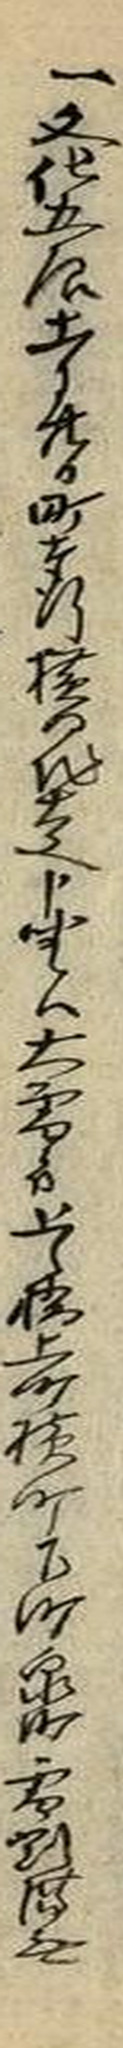一文化五辰十一月廿日町奉行横田作大夫申聞候は大雪に付上之橋上町横町下町泉町雪割場無
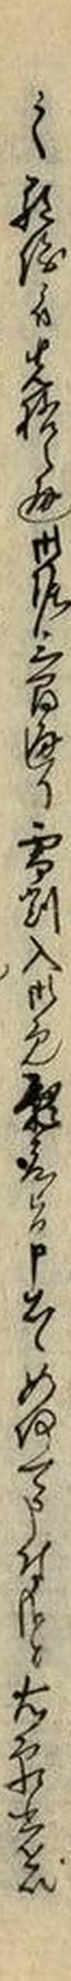之難儀に付先格之通御堀三間通り雪割入御免願度旨申出候如何可申付哉と右願書を以
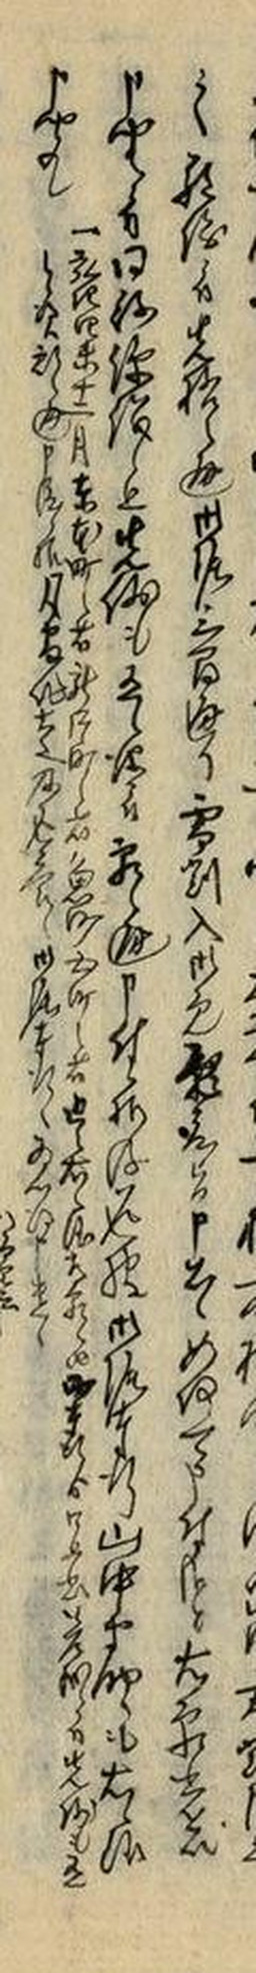申聞候に付同役評議之上先例も有之儀に付願之通申付候様及返報御堀奉行山中半助へも右之趣
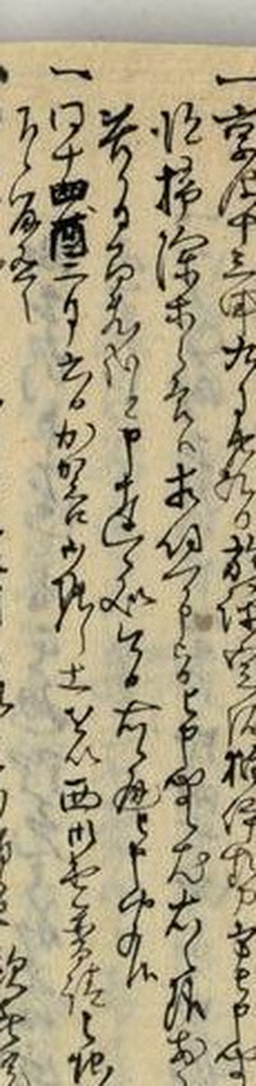苦かる間敷哉と申達候処今日右之通被申聞候
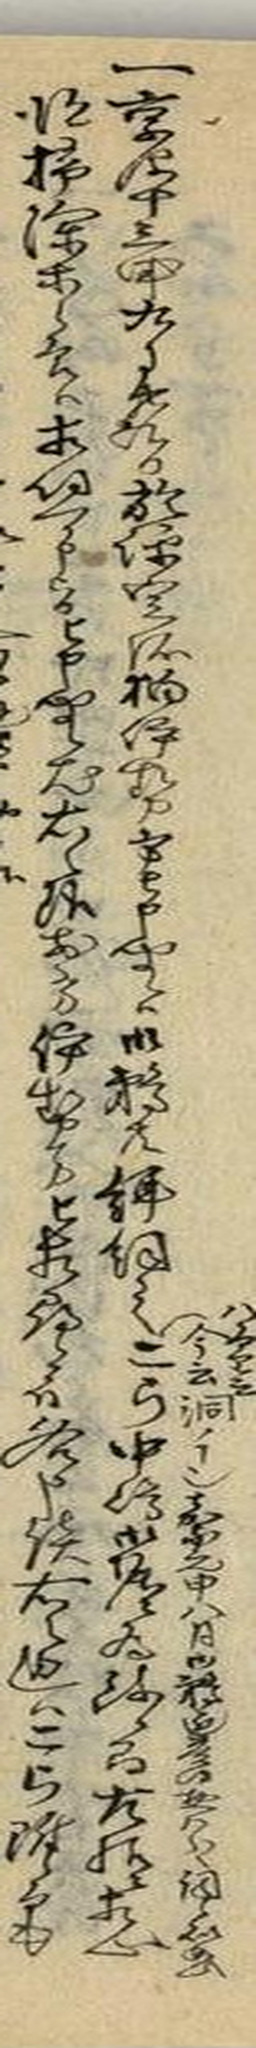得掃除等之節は相伺可申旨被申聞候尤右之趣前方伊勢方被相尋候に付各申談右之辺はこら附候ても
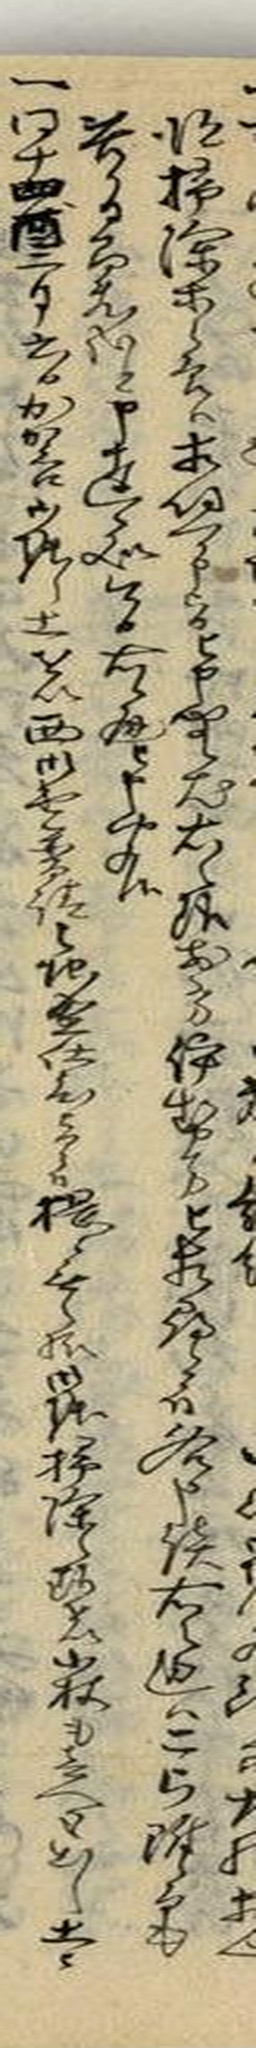一同十四酉二月六日加賀口御堀之土を以西御堂普請之地盛仕度旨に付猥に無之様御堀掃除之趣を以小杖も壱人ツヽ出し土被
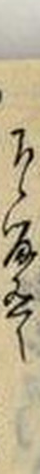下候留有之
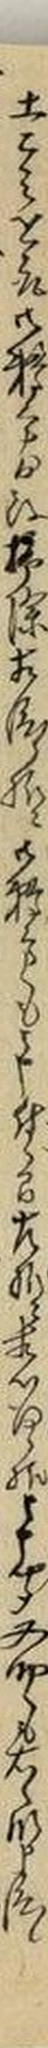土こみを取御鵜方ゟ致掃除相渡候様に御鵜方へも被申付候間左様に相心得候様被申聞又助へも右之段申渡候
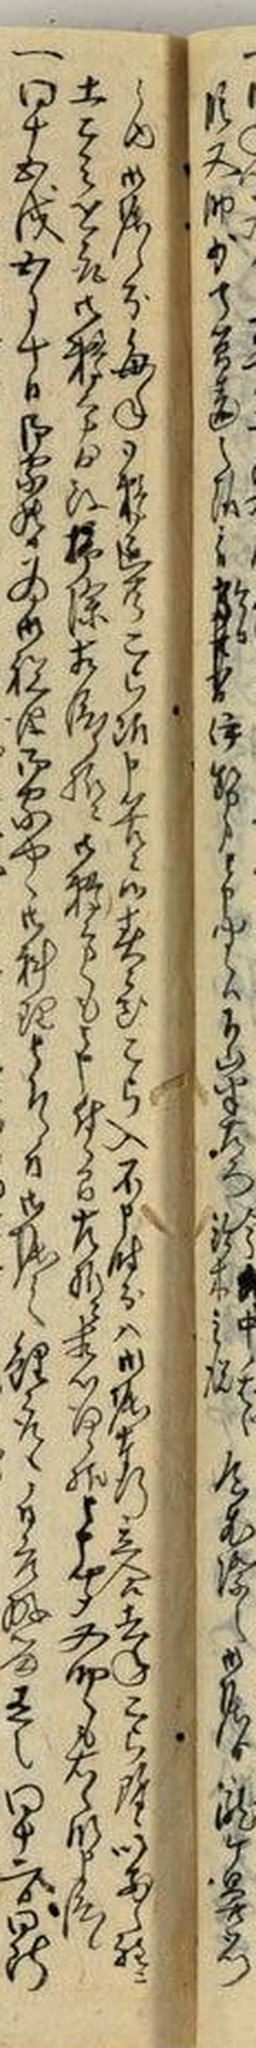之内御堀之分毎年御鵜匠共こら附申筈に候春に至こら入不申時分は御堀奉行立合去年こら附以前之程に
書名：御城下諸事之部
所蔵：福井県文書館 Fukui Prefectural Archives
